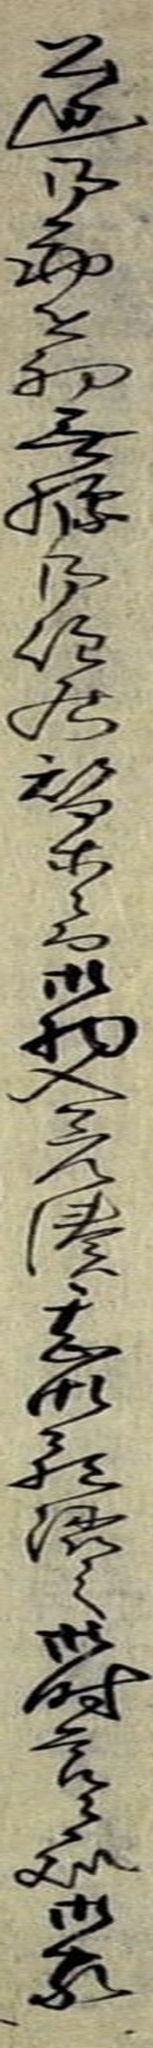公辺御勤を初無拠御住居替等に而御物入差湊甚御難渋之御時節に候処御家
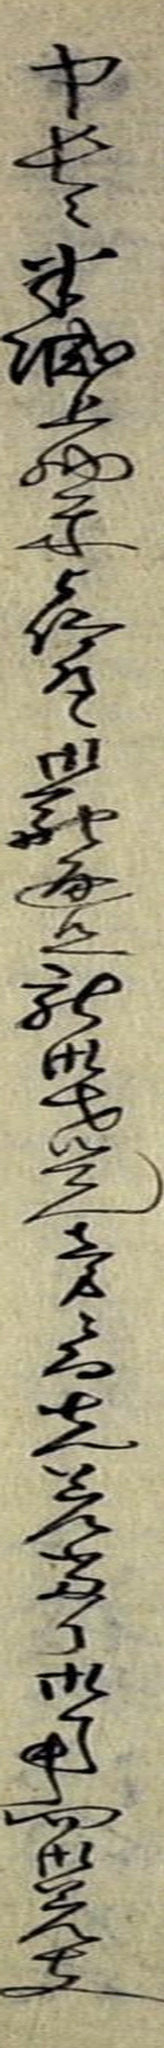中長々半減上納米被仰付候御融通且新御才覚旁に而先差当り御用向御差支
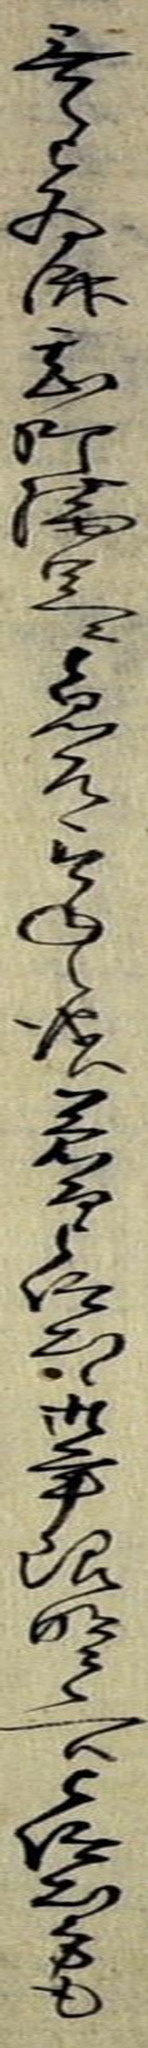無之被為済甚御満足に被思召候今年之儀は兼而被仰出候御年限明に候へは被仰出方も
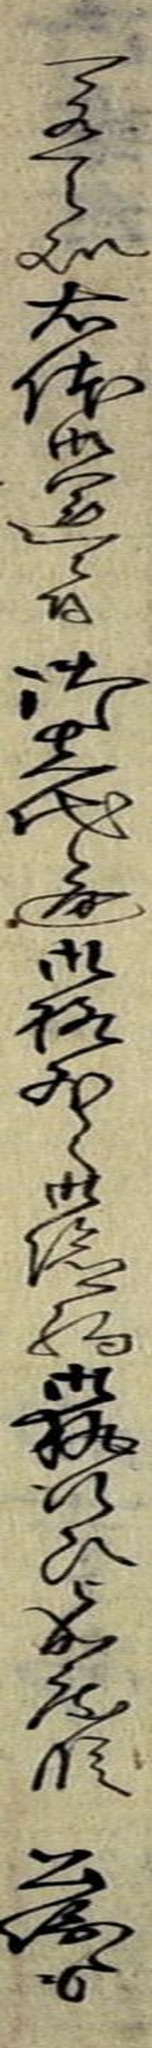可有之処右体御運に付御先代之通御格外之御倹約御執行ひ被成度段公儀へも
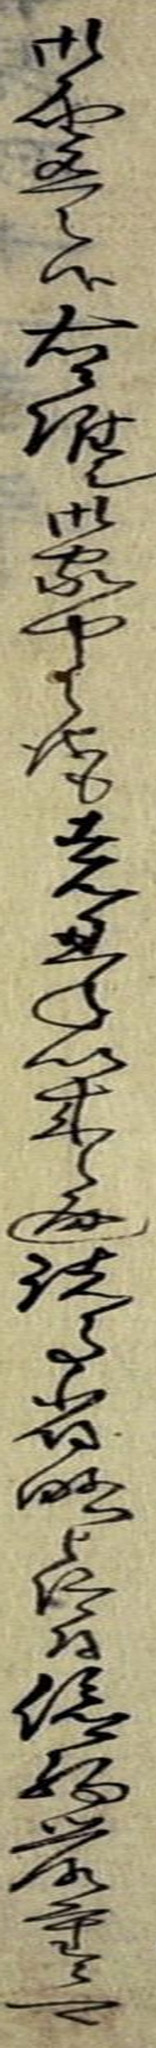御届有之候右に准し御家中之儀も去ル丑年以来之通諸事省略被仰付倹約厳重に可
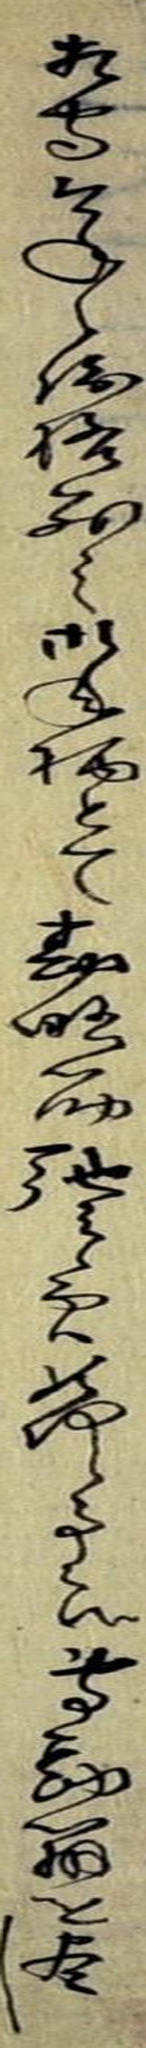相守今年之儀格別之御年柄とて勘略筋弛み候而は如何之事に候専勘弁を尽し
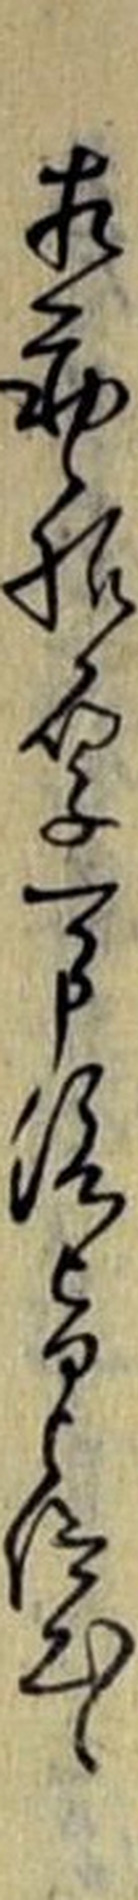相勤候様厚可申渡旨被仰出候
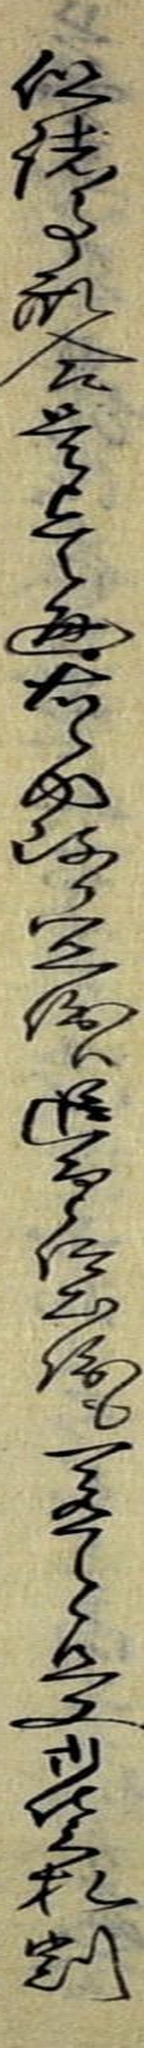但諸事形合是迄之通右之内改り宜儀は追而被仰出儀も可有之且又御貸札割
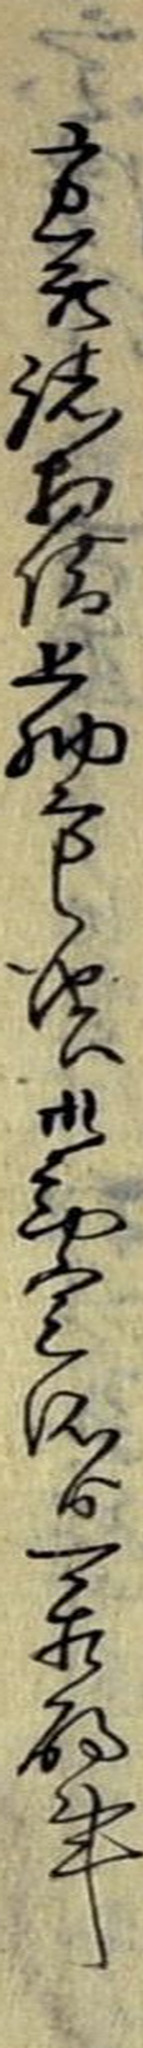方并諸拝借上納方之儀は御勘定所ゟ可相触事
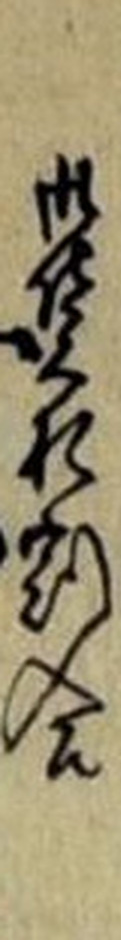御貸札割合
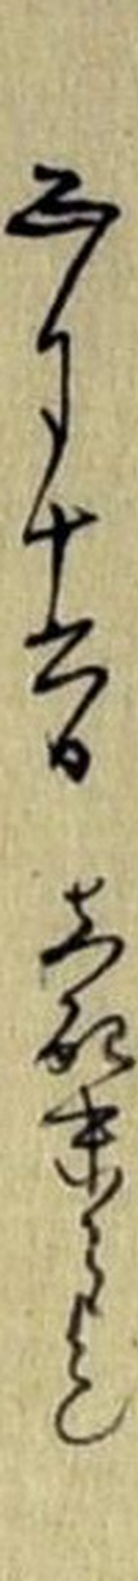正月十六日支配末々迄
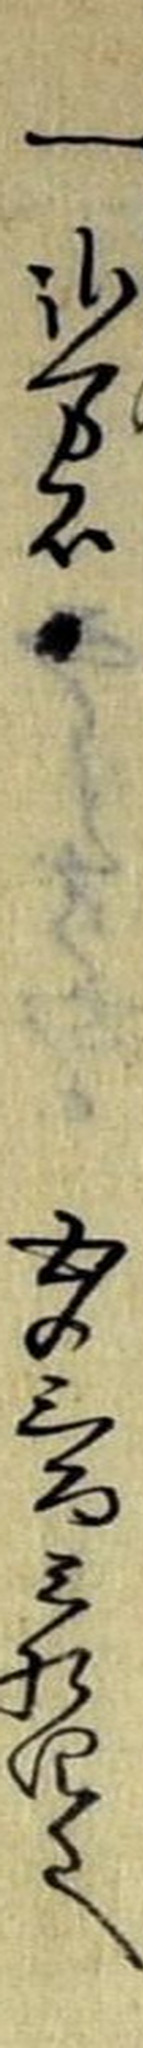一弐万石五〆三百三拾四匁
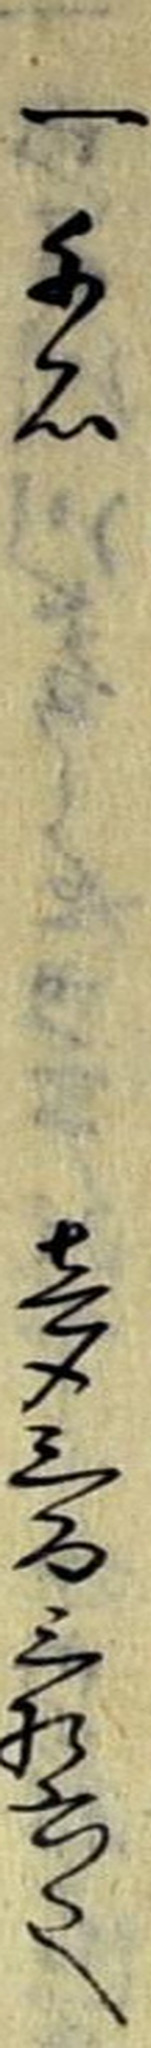一千石壱〆三百三拾六匁
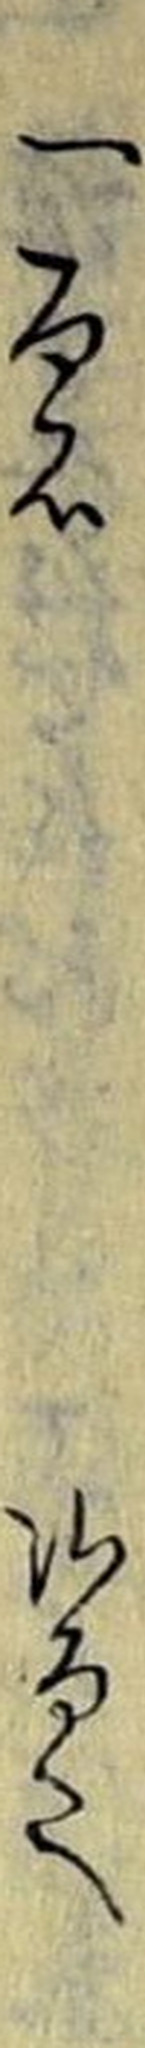一百石弐百匁
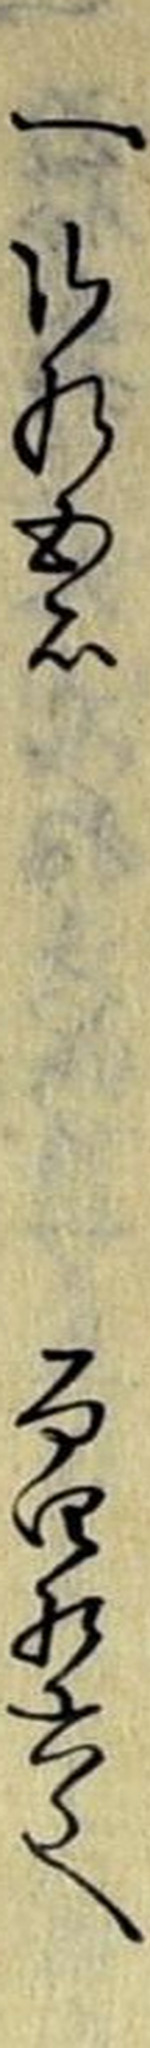一弐拾五石百四拾六匁
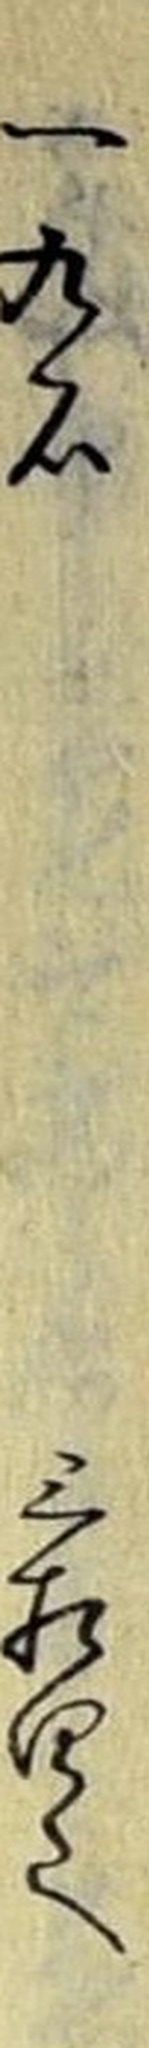一九石三拾四匁
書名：命令之部 四
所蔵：福井県文書館 Fukui Prefectural Archives
